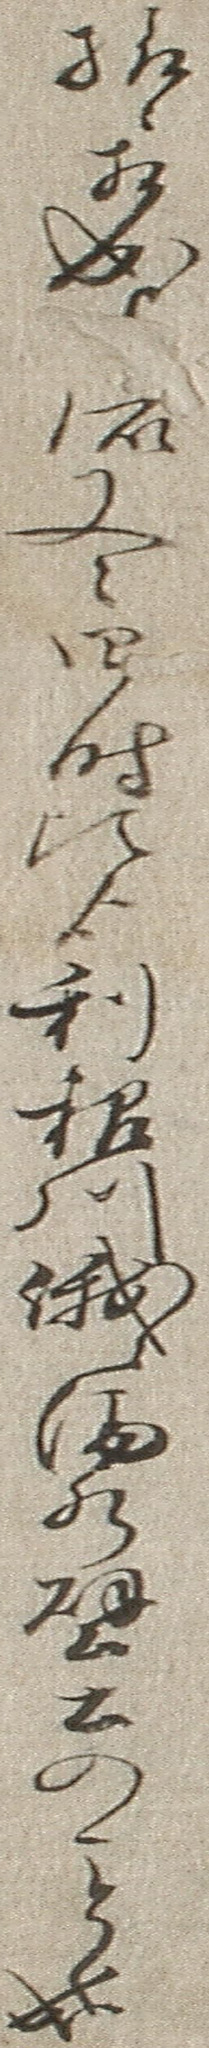様に相成候所又々四時頃ゟ利根川俄に満水壁土のことく成
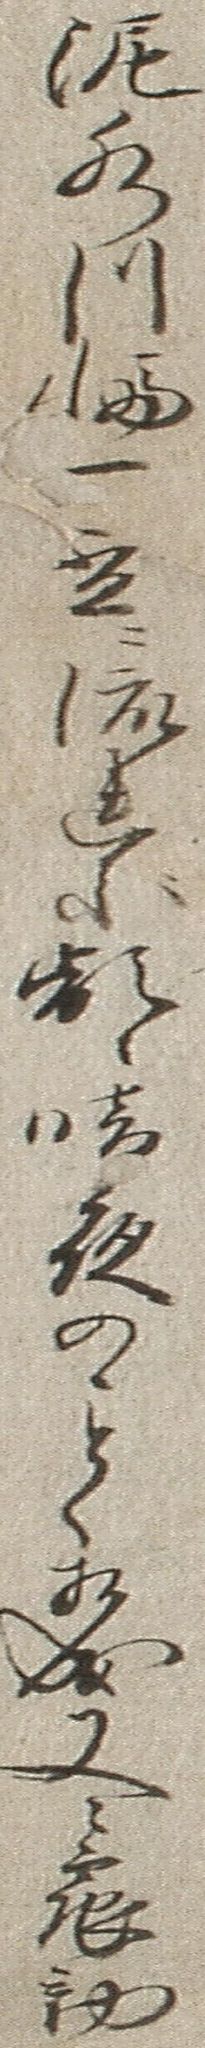泥水川幅一盃に流れ参頻に晴夜のことく相成又々震動
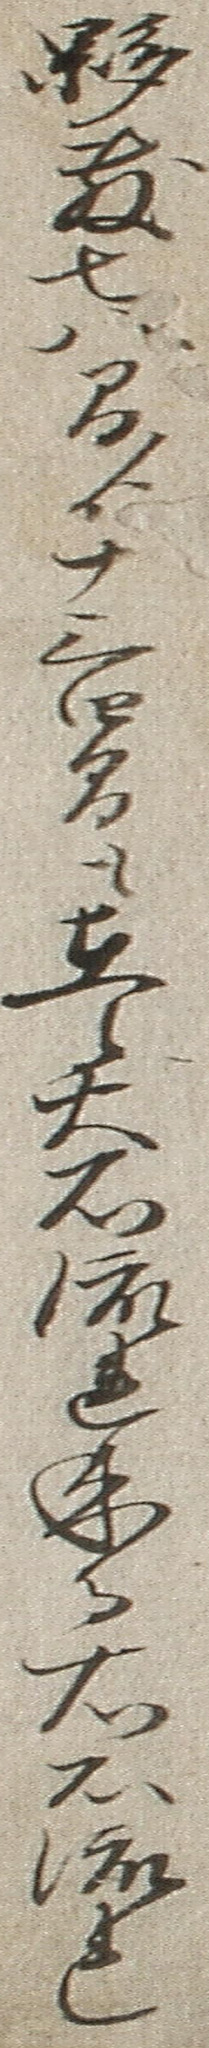夥敷七八間ゟ十三四間も在之火石流れ来る右石流れ
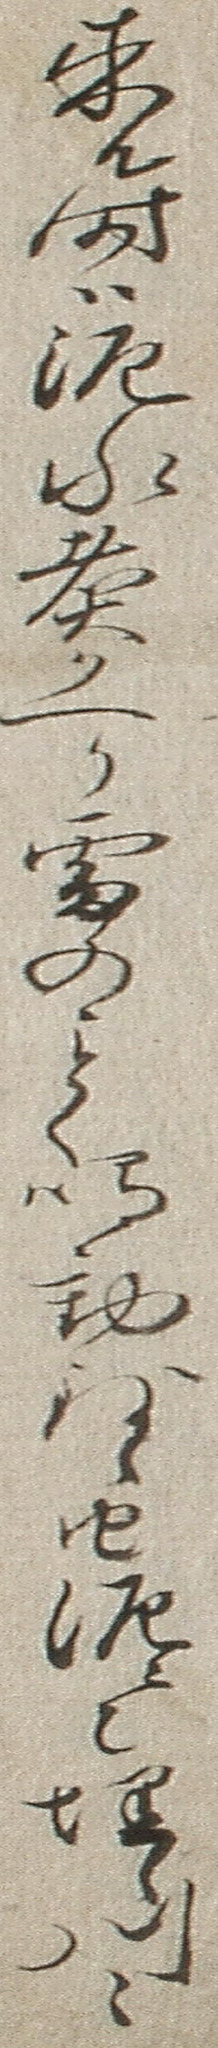来る時は泥水煮かへり雷のことく鳴動致候由泥にて埋候川々
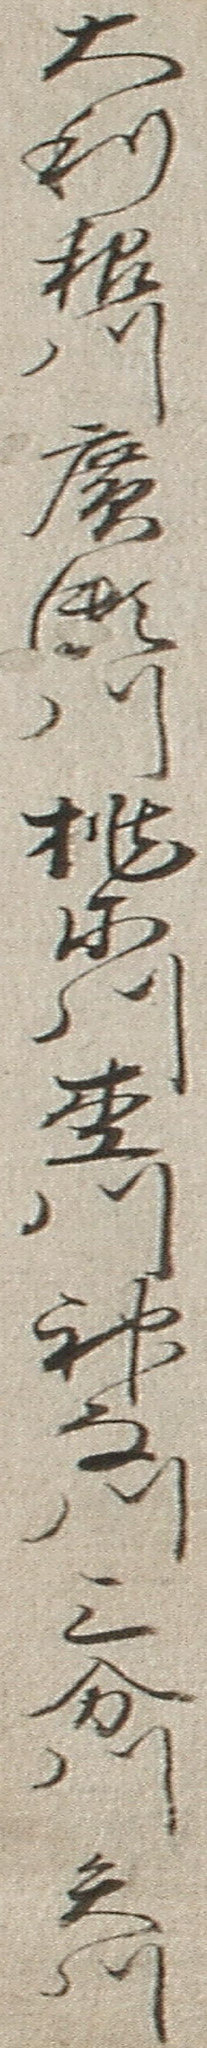大利根川広瀬川桃木川杢川神な川三分川矢川

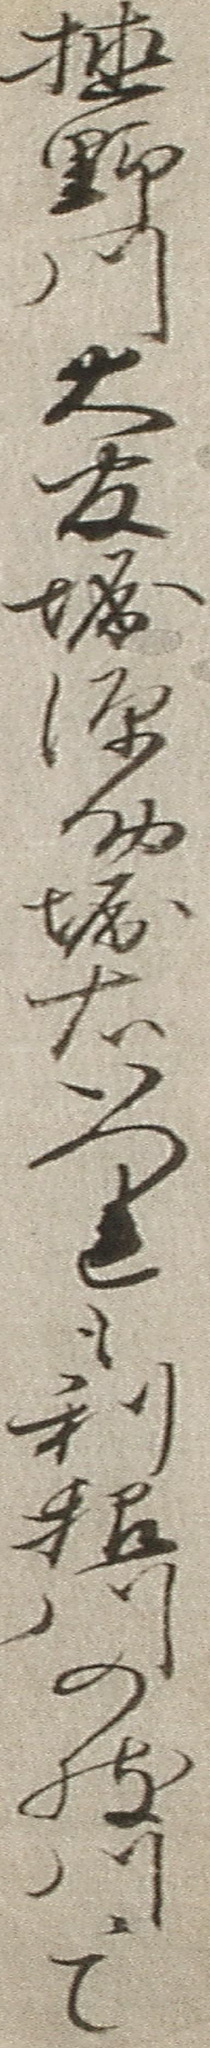植野川大官堀源助堀右いつれも利根川之枝川にて
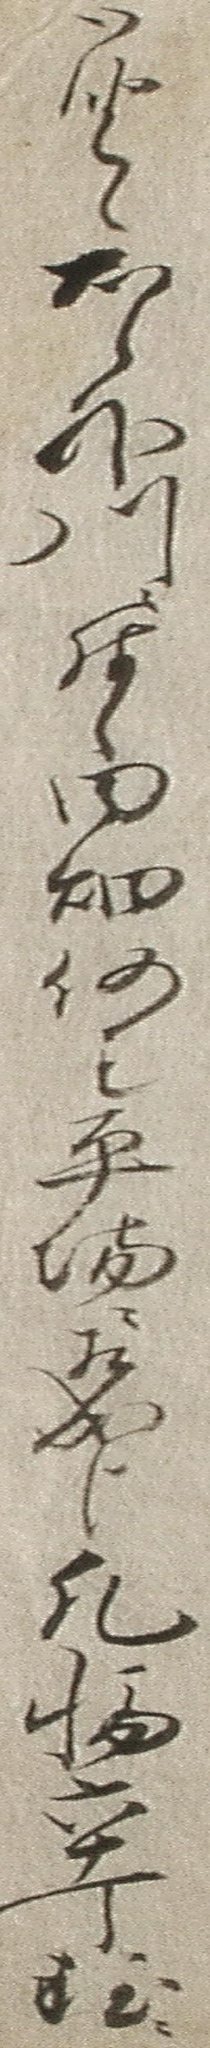御座候右之外川ニ付候田畑何も平場に相成申候凡幅六十丁程に
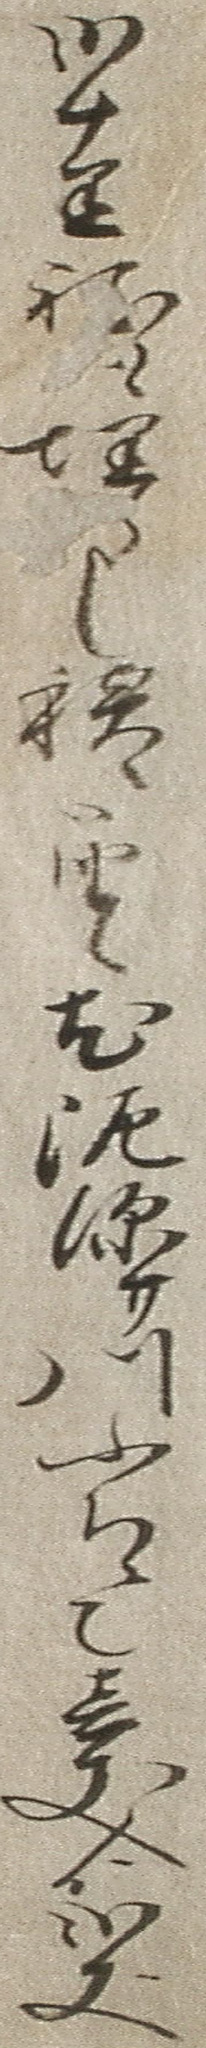弐十里程も埋り申候程？に御座候尤泥深さ川ふちにて壱丈ゟ弐丈
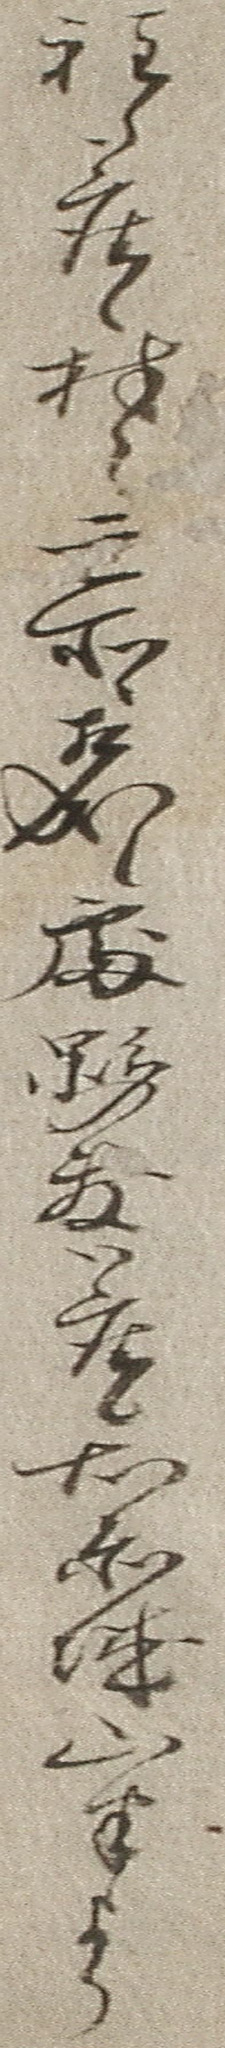程御座候村々亡所に相成候処夥敷御座候右赤城山半より
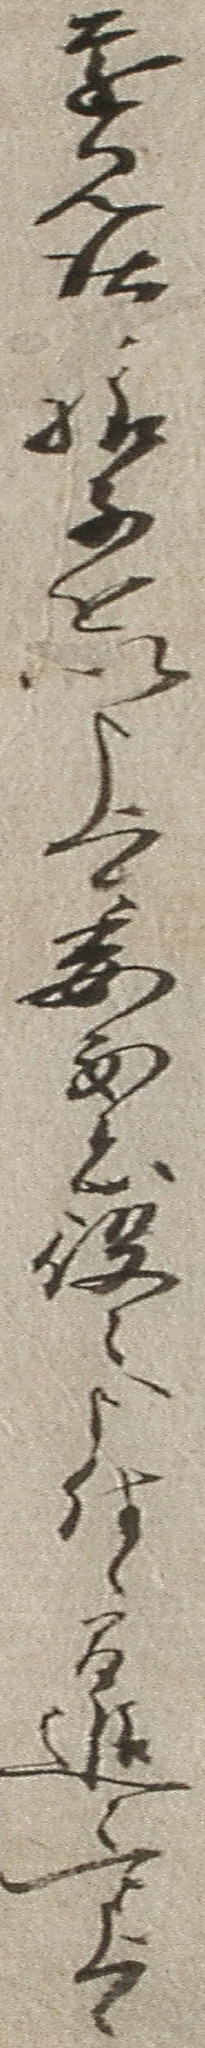遠見仕候様子を以申上候委義者役々へ申付候間追々可申上候
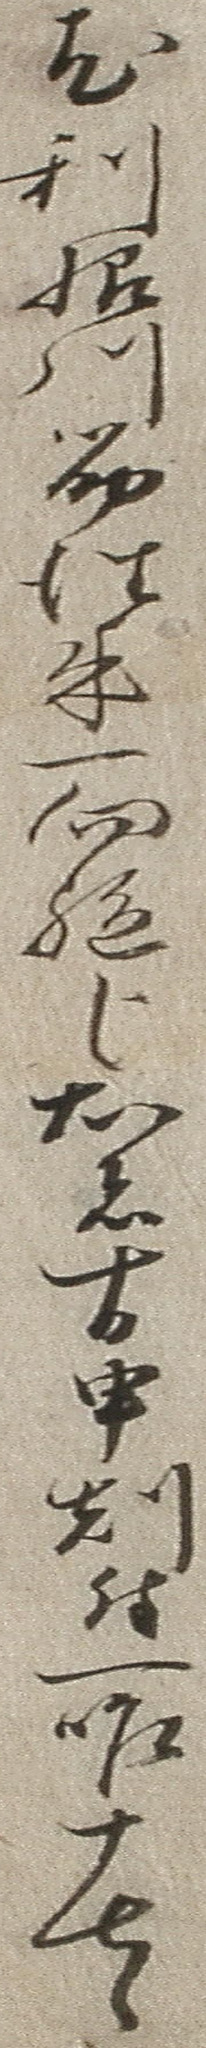尤利根川筋往来一向絶申候右者十日申刻付一昨十七日
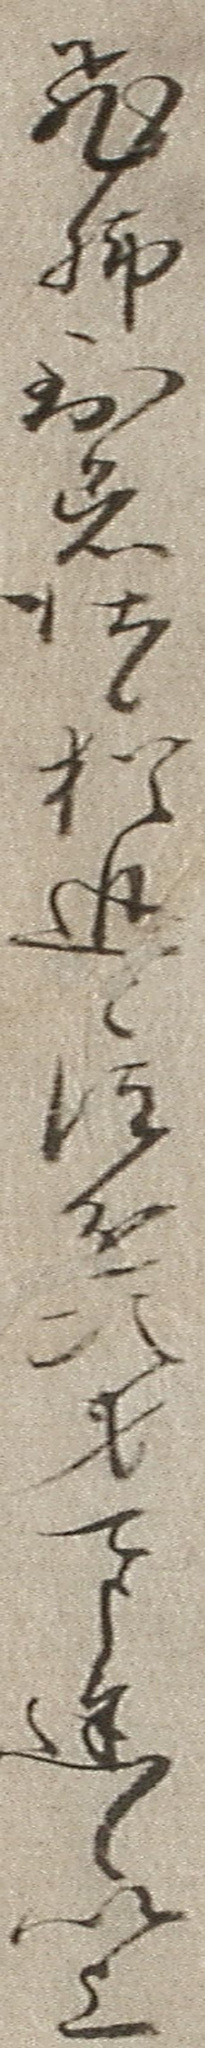飛脚到着仕候猶追々注進次第可申達候以上
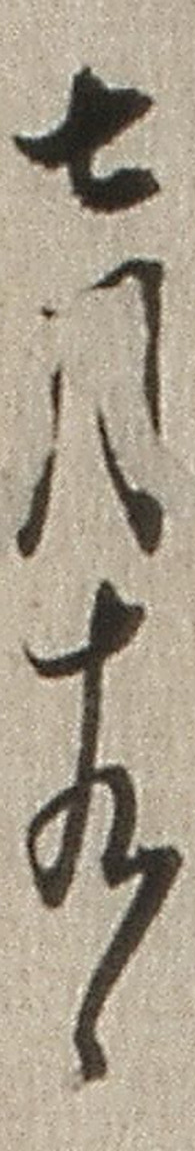七月十九日
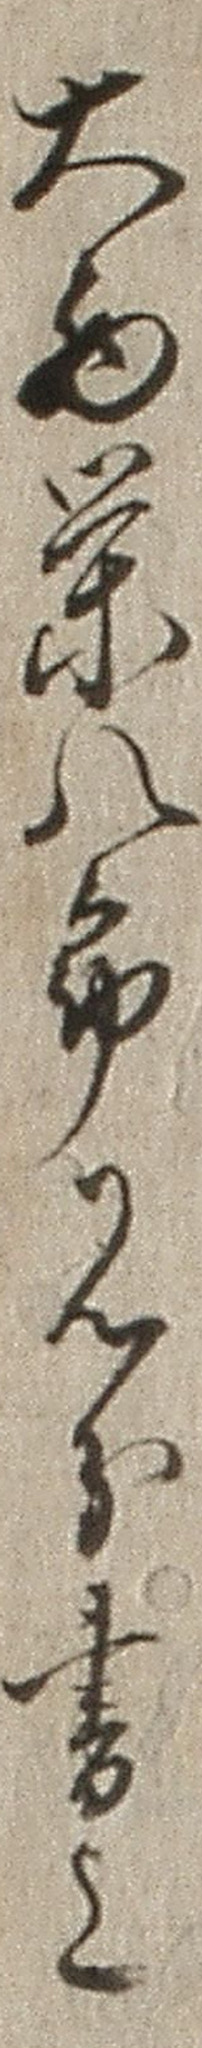大西栄八郎見分書上
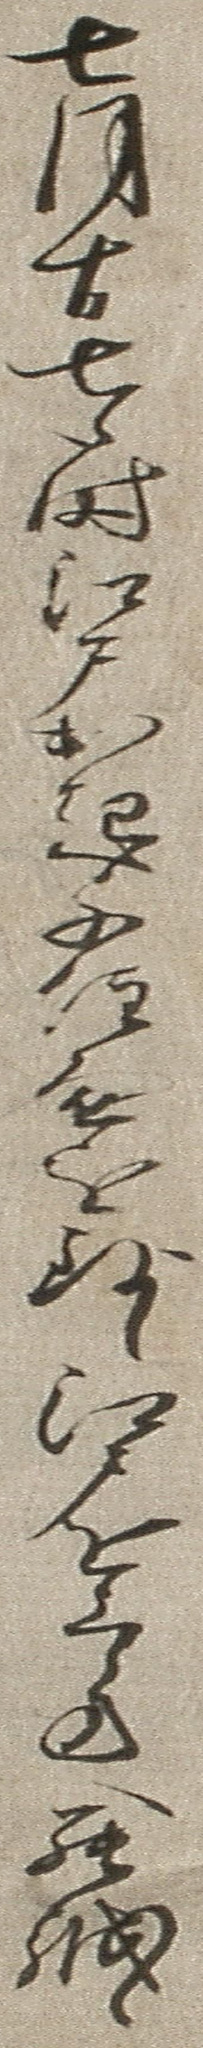七月十日七ッ時江戸出起千住通を致候江戸を上方へ罷越候
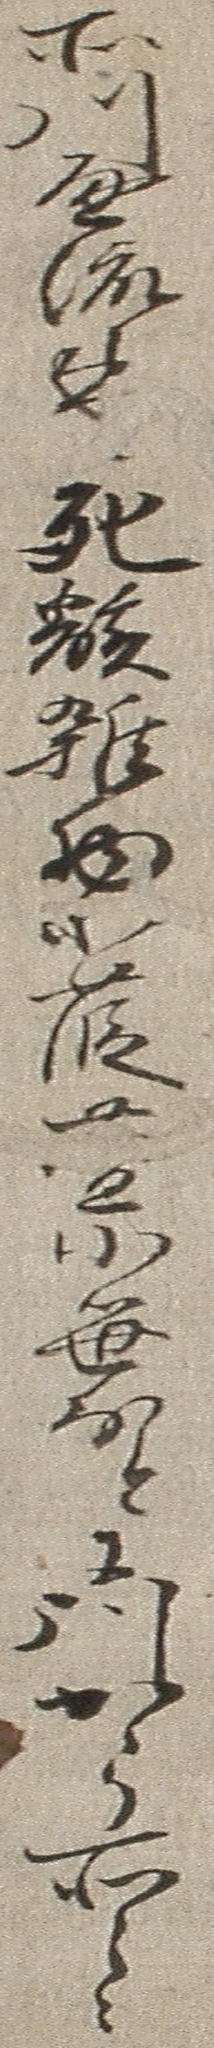所川通流来死骸雑物小葭萱小笹などに引かゝり所々ニ
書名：太平秘録抜書　浅間山燒及普賢山崩
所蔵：東京大学地震研究所図書室 Earthquake Research Institute Library, The University of Tokyo, JAPAN
